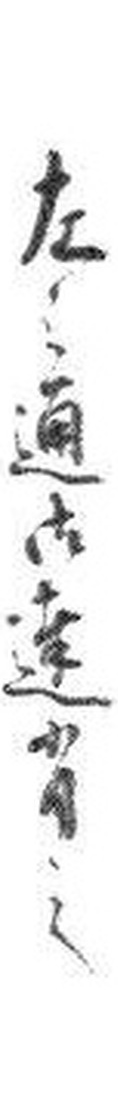左之通御達有之
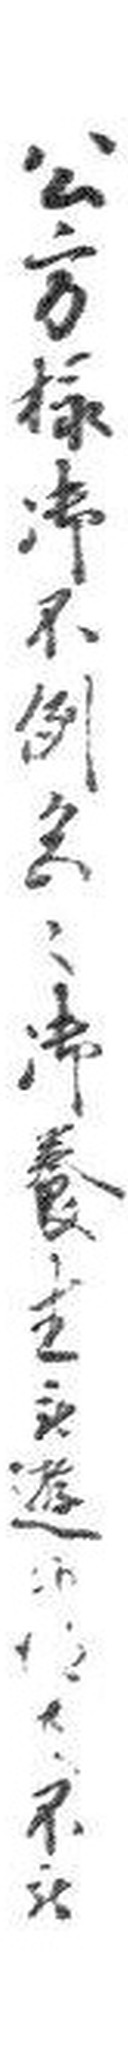公方様御不例色々御養生被遊候得共不被
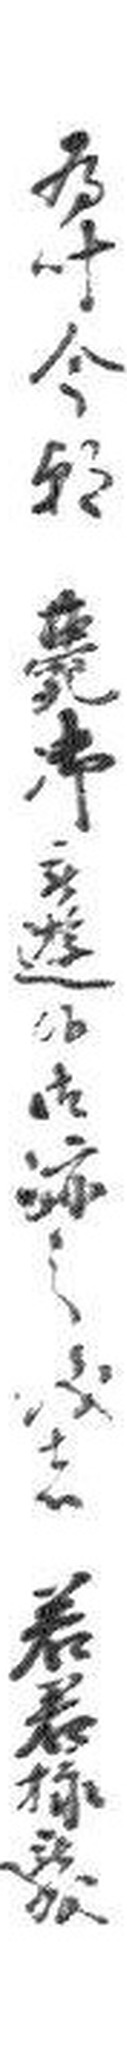為叶今朝薨御被遊候御跡之儀者若君様被成
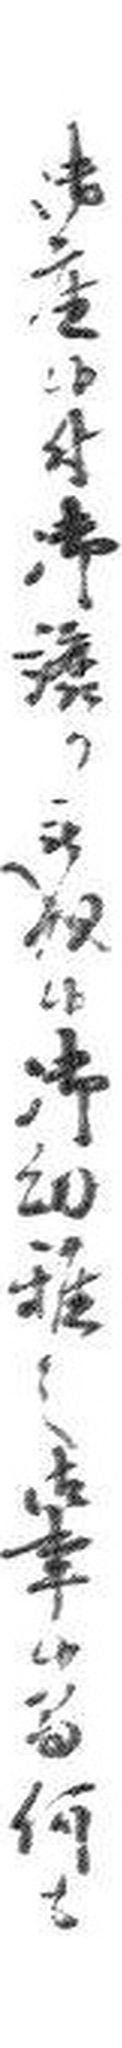御座候付御譲り被成候御幼稚之御事候間何も
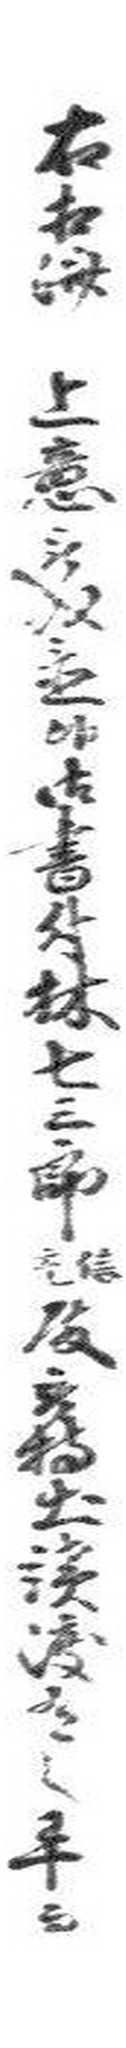右相済上意被成置候御書付林七三郎信充殿被持出読渡有之畢而
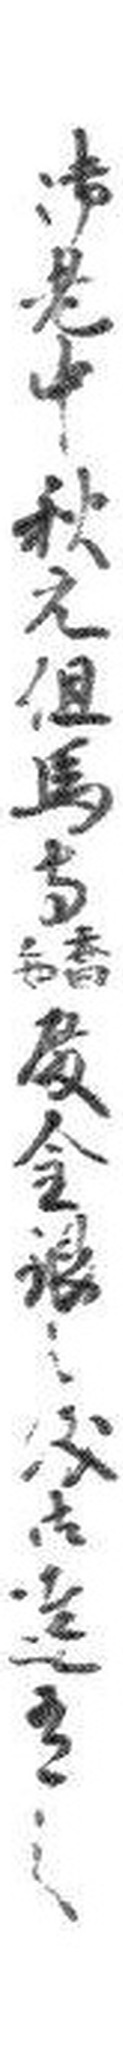御老中秋元但馬守喬知殿金銀之儀御達有之
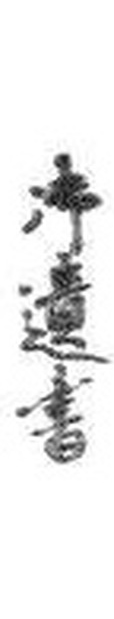御遺書
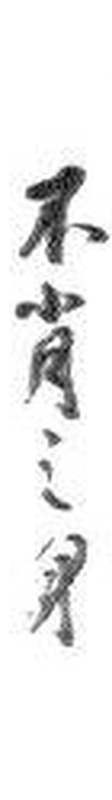不肖之身
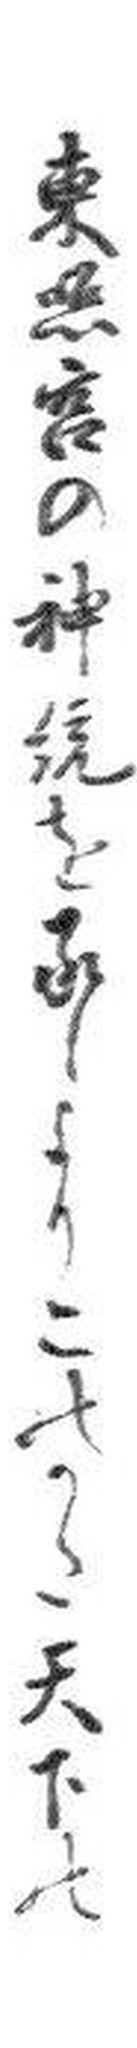東照宮之神統を承しよりこのかた天下の
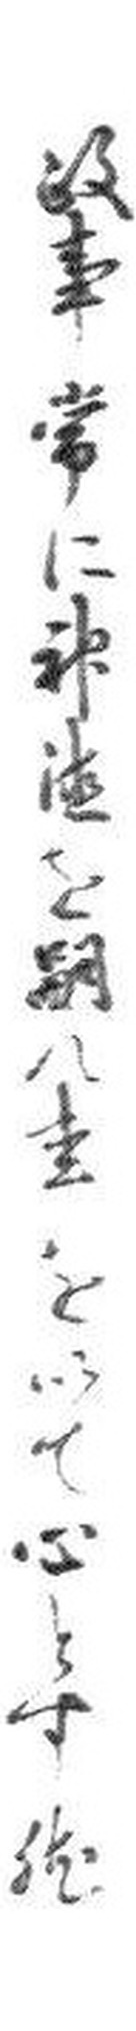政事常に神徳を嗣ん事を以て心とす然

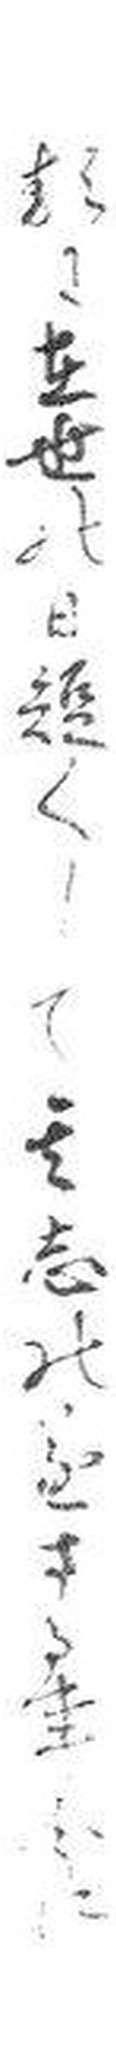るに在世の日短くして其志の遂さる事今に
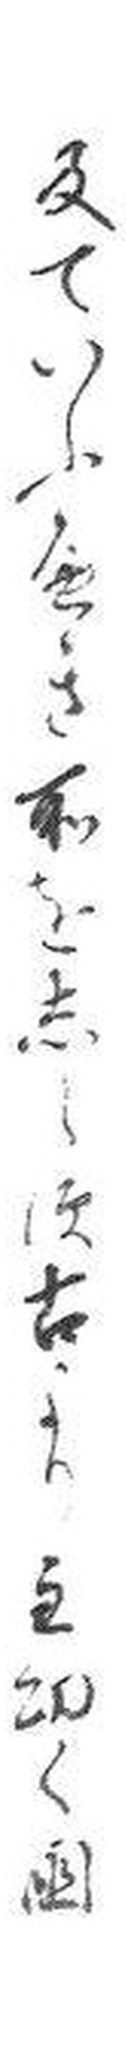及ていふへき所をしらす古より主幼く国
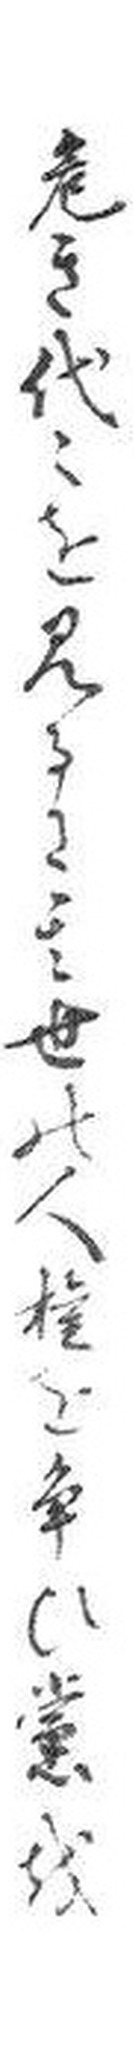危き代々を見るに其世の人権を争ひ党を
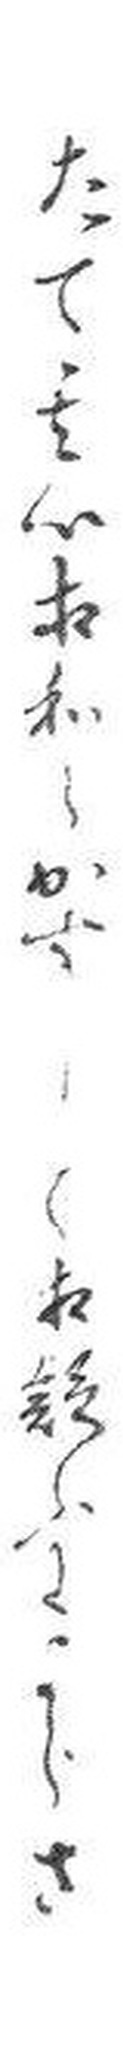たて其心相和らかすして相疑ふによらさ
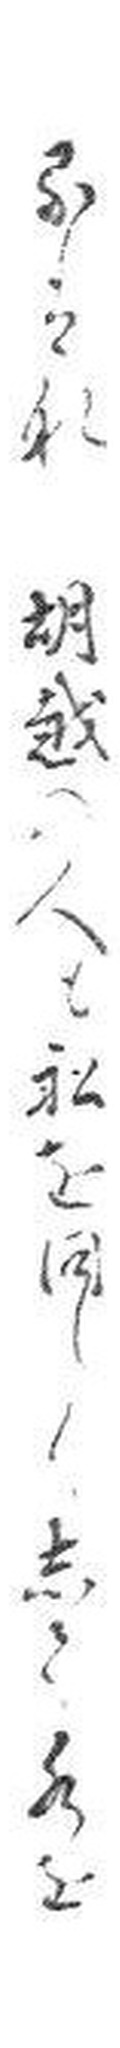るかな胡越の人も船を同しくして水を
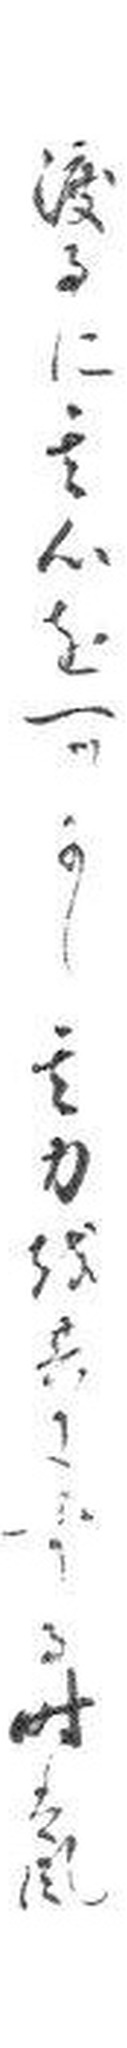渡るに其心を一ツにし其力を共にする時は風
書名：家譜 二十九 吉邦公 従正徳二年到正徳三年
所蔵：福井県文書館 Fukui Prefectural Archives
